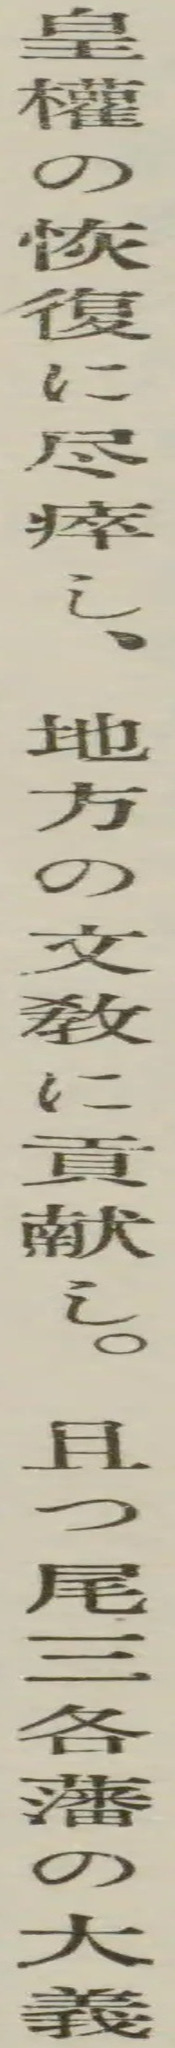皇権の恢復に尽瘁し、地方の文教に貢献し。且つ尾三各藩の大義
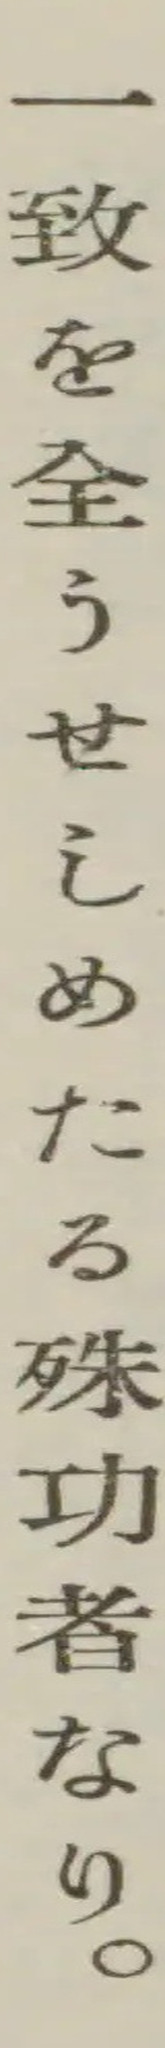一致を全うせしめたる殊功者なり。
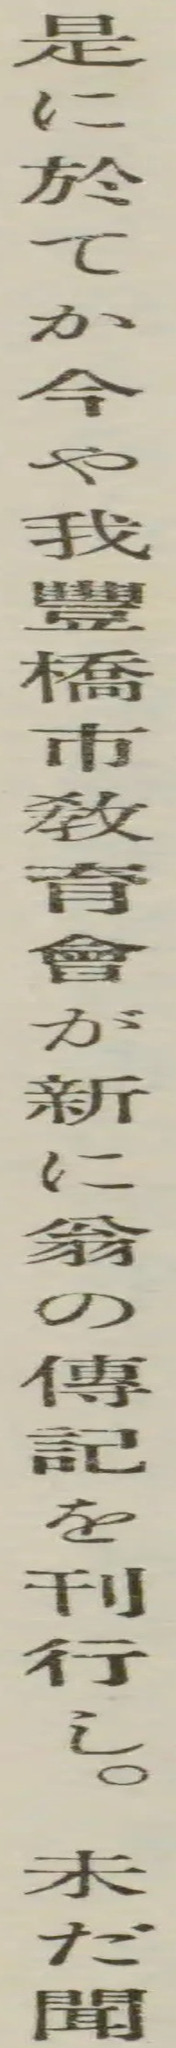是に於てか今や我豊橋市教育会が新に翁の伝記を刊行し。未だ聞
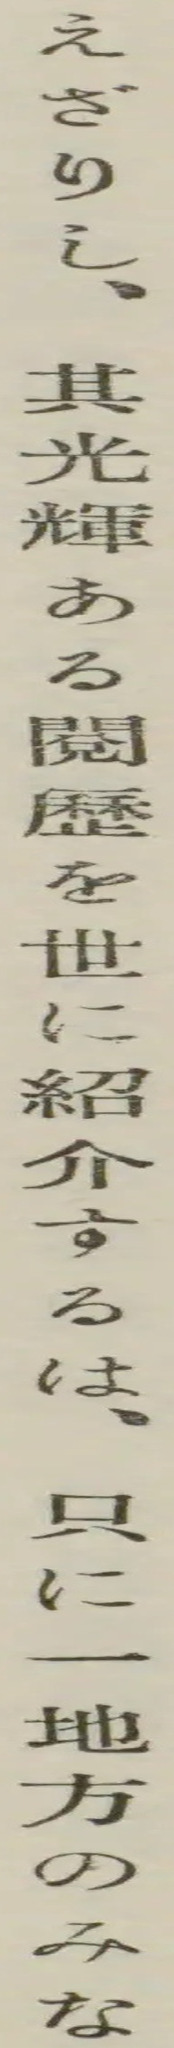えざりし、其光輝ある閲歴を世に紹介するは、只に一地方のみな
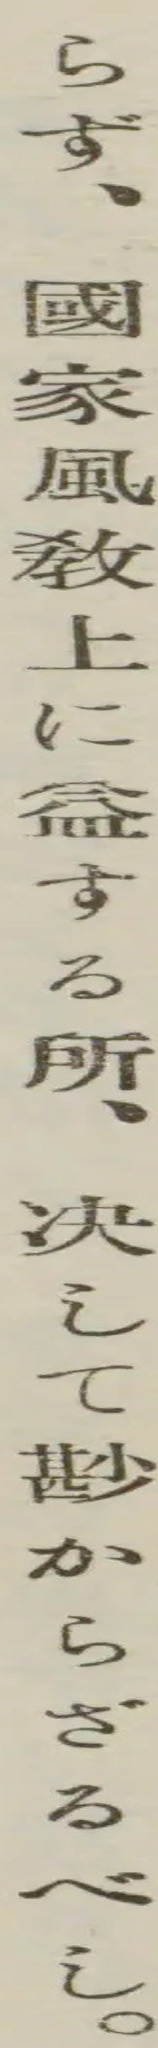らず、国家風教上に益する所、決して尠からざるべし。
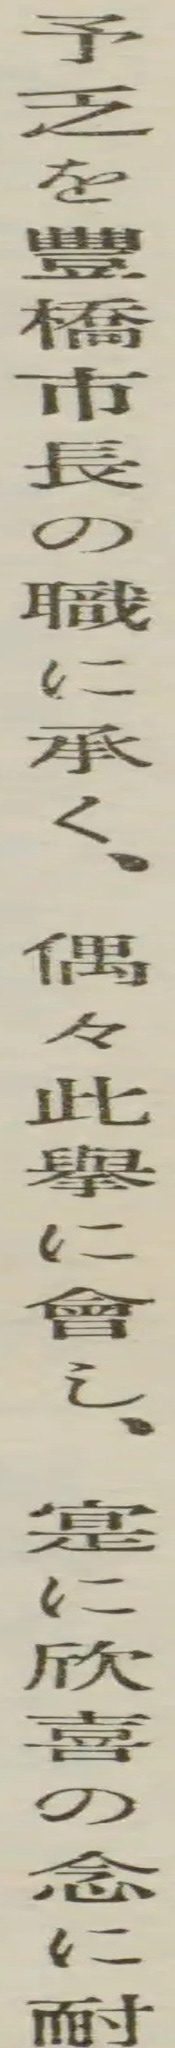予乏を豊橋市長の職に承く、偶々此挙に会し、寔に欣喜の念に耐
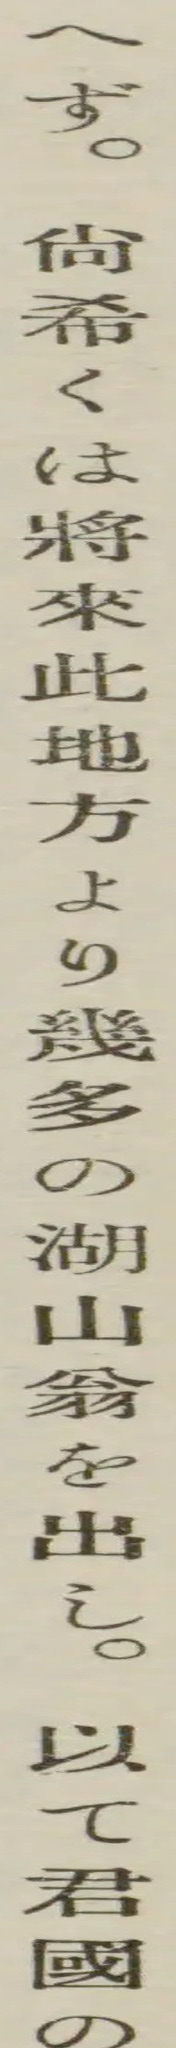へず。尚希くは将来此地方より幾多の湖山翁を出し。以て君国の
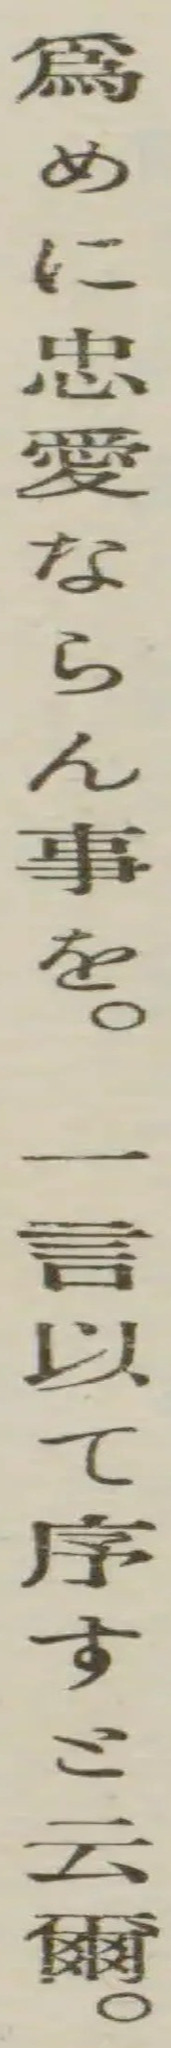為めに忠愛ならん事を。一言以て序すと云爾。
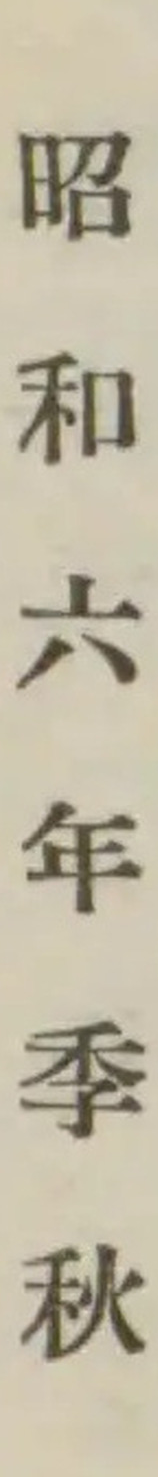昭和六年季秋
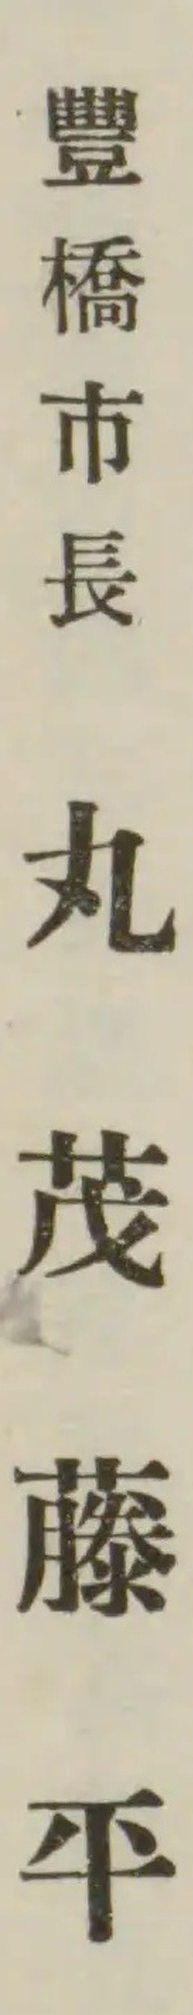豊橋市長丸茂藤平

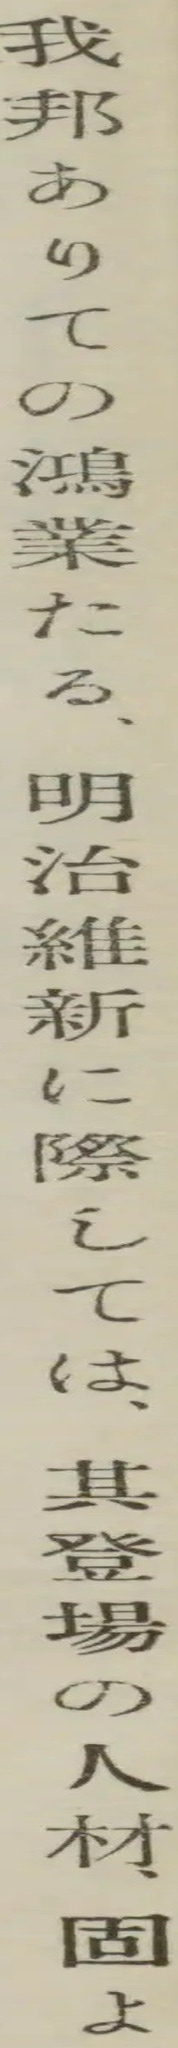我邦ありての鴻業たる、明治維新に際しては、其登場の人材、固よ
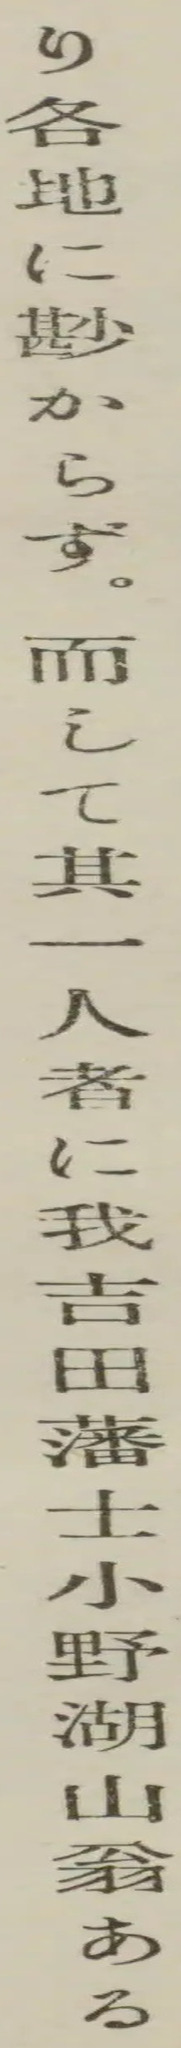り各地に尠からず。而して其一人者に我吉田藩士小野湖山翁ある
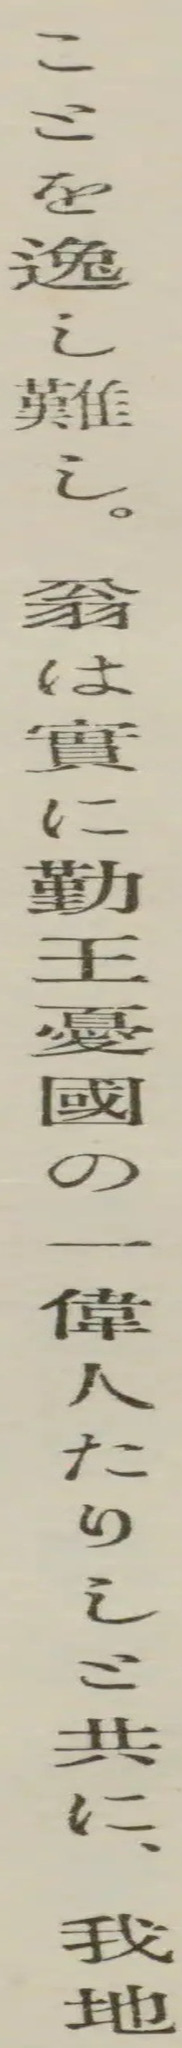ことを逸し難し。翁は実に勤王憂国の一偉人たりしと共に、我地
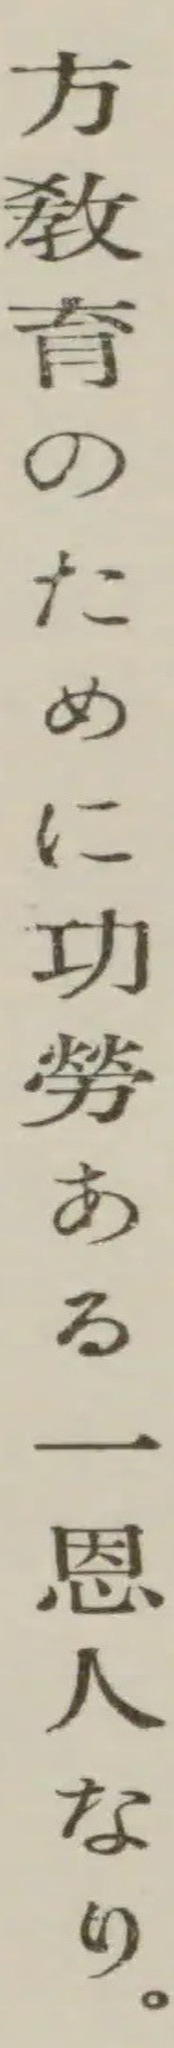方教育のために功労ある一恩人なり。
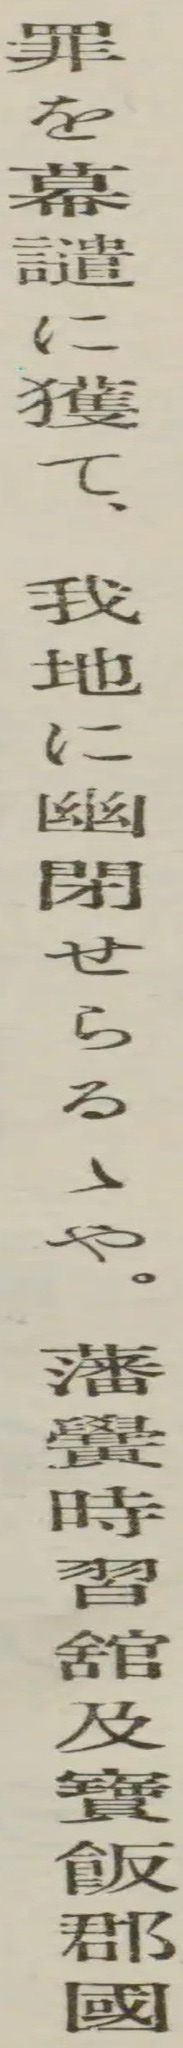罪を幕譴に獲て、我地に幽閉せらるゝや。藩黌時習館及宝飯郡国
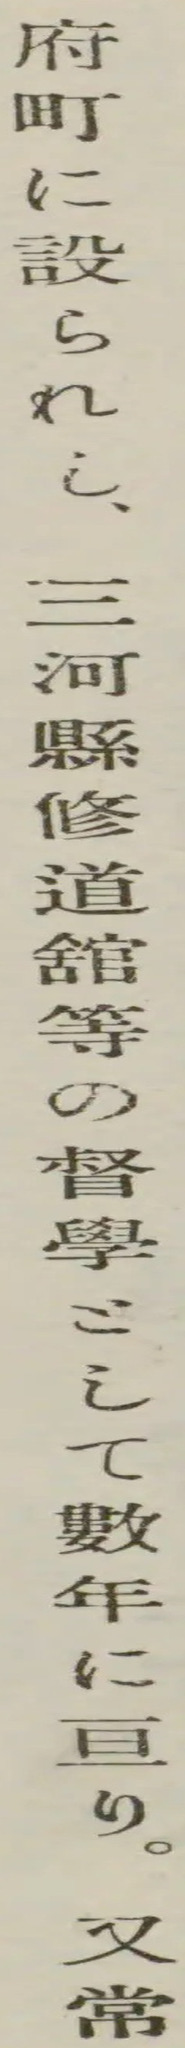府町に設られし、三河県修道館等の督学として数年に亘り。又常
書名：小野湖山翁小伝
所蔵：国立国会図書館 National Diet Library, JAPAN
